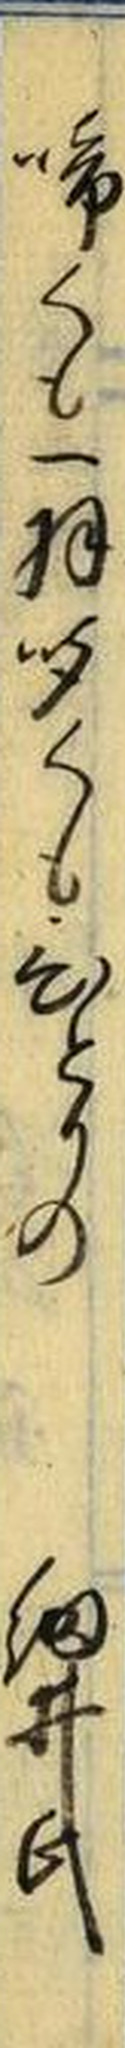啼くも一羽聞くもひとりの細井氏
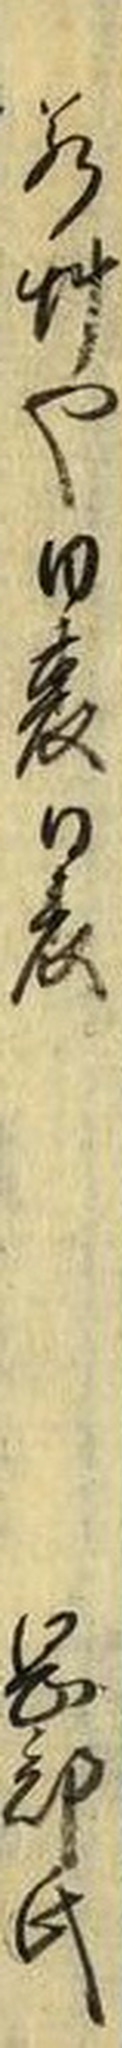若竹や日裏日表岡部氏
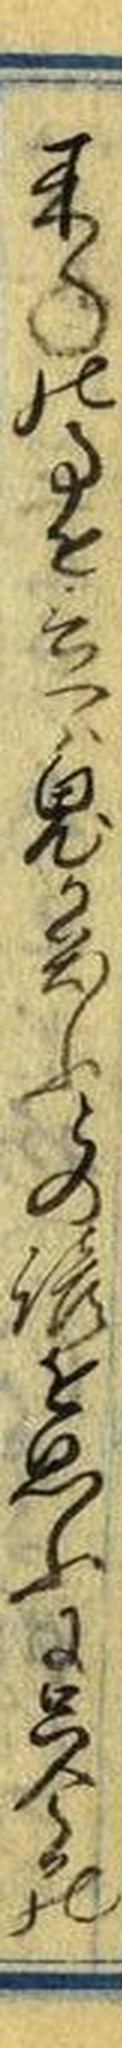来年の事を言へは鬼か笑ふとの諺を思ふに只今日の
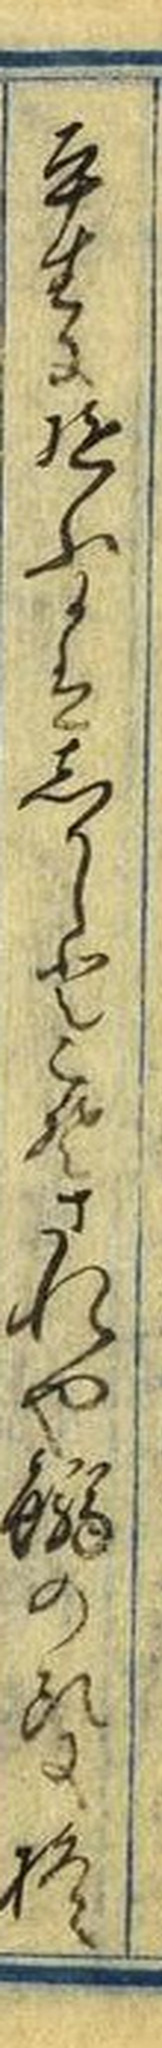平生に遊ふにはしかしとこそされや鰯の頭に柊
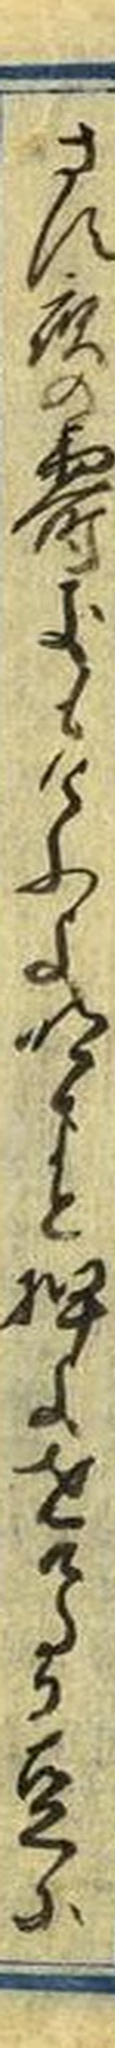さす夜の寿きもけふよ明日よと押よせけるか豆に
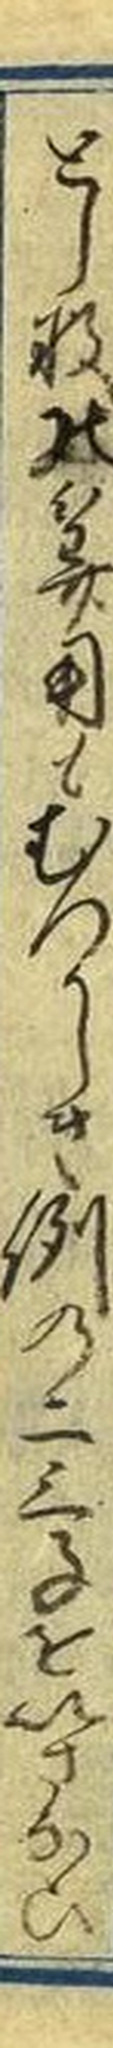とし数の算用もむつかしき例の二三子をいさなひ
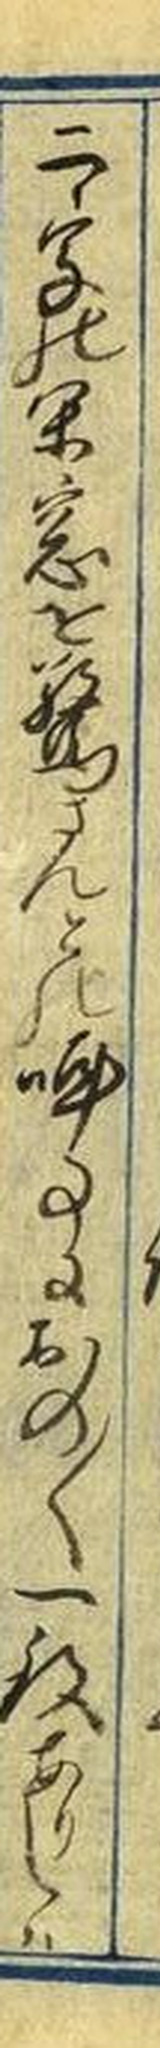二宇の閑窓を驚さんとの呼事におの〳〵一致ありしは
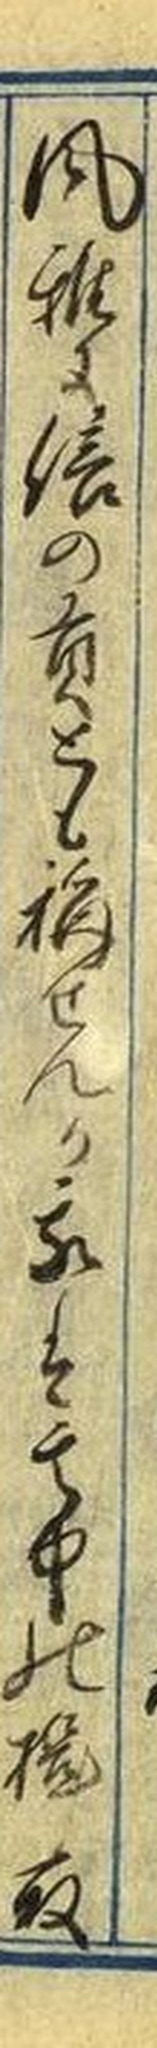風雅に倍の貢とも称せんか我は其中の楫取
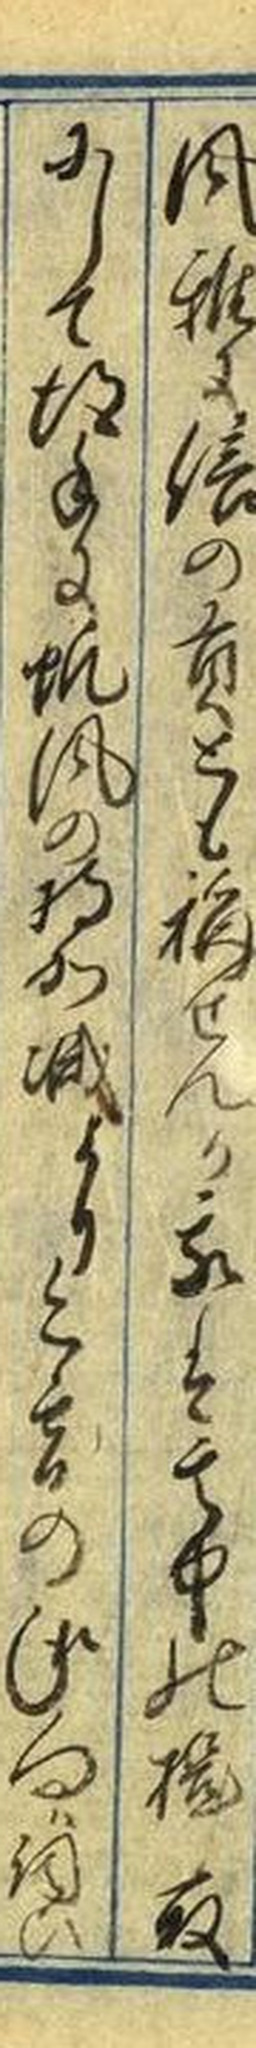にして得手に帆風の持加減より今宵の趣向は伺ひ
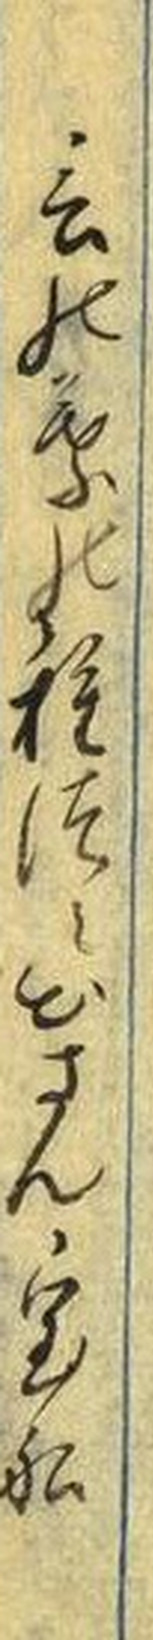言の葉の種つと出さん宝船

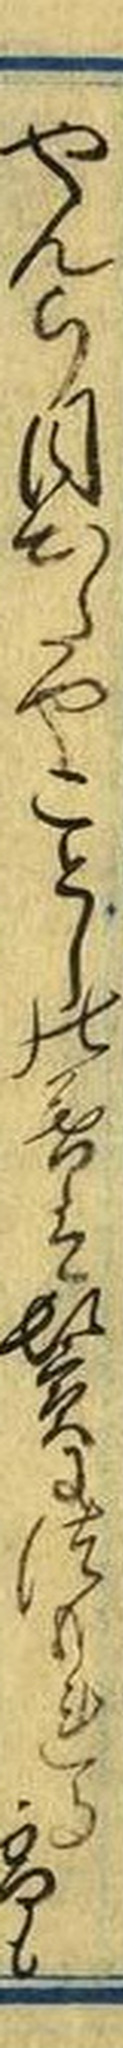やんら目出たやことしの暮は鬢につもれる雪も
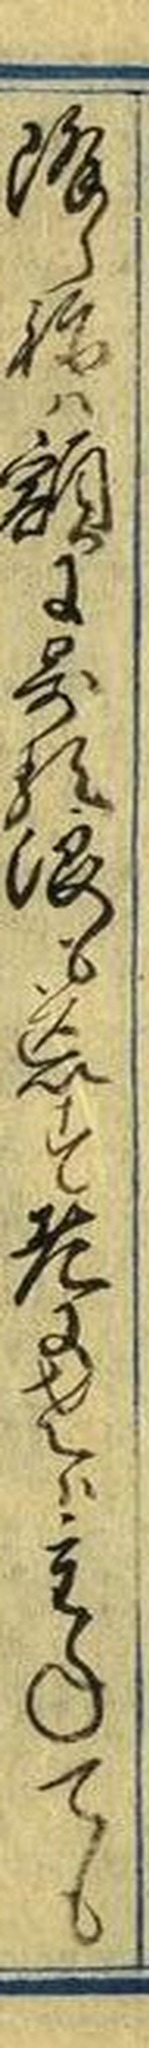降らねは額に寄る浪も荒す老に老は重ねても
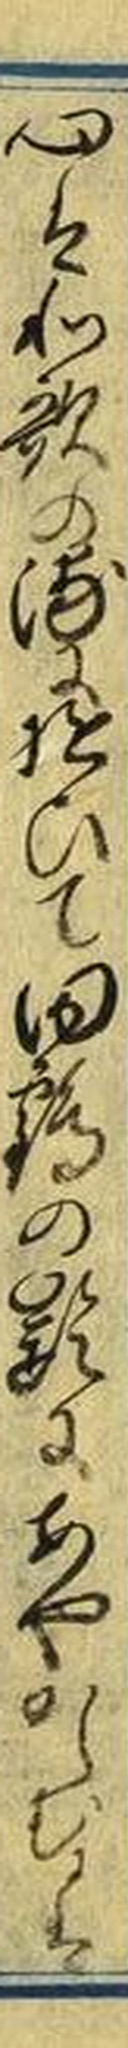心は和歌の浦に遊ひて田鶴の齢にあやからむには
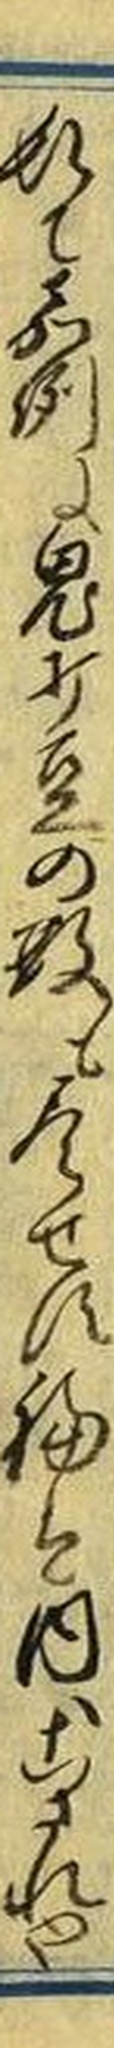頓て嘉例に鬼打豆の数も尽せす福は内へこされや
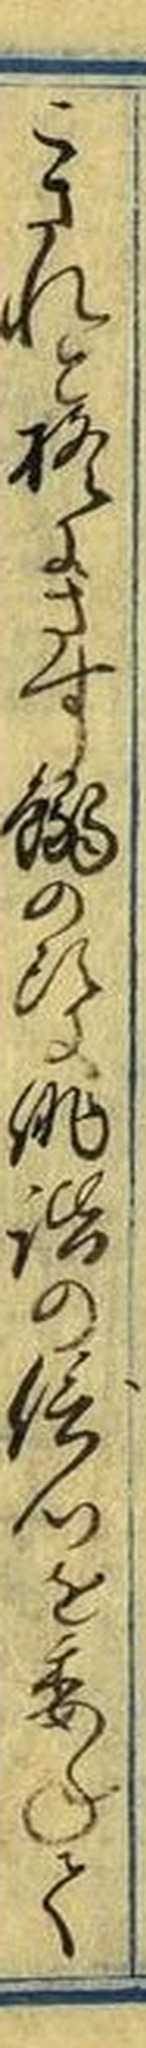こされと柊にさす鰯の頭に俳諧の信心を委ねて
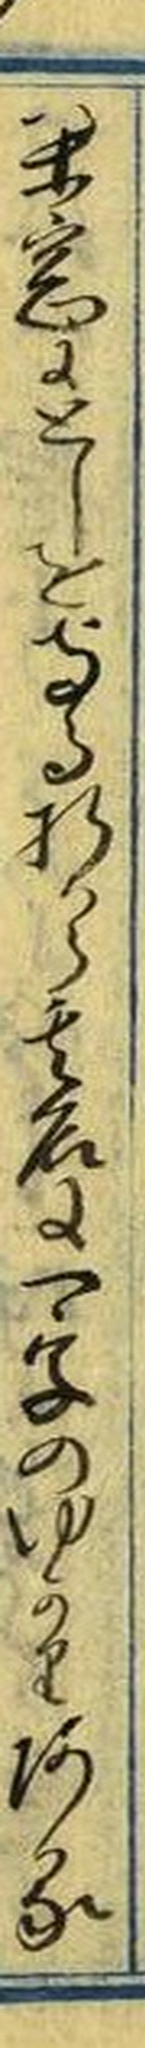閑窓にとしを守る折から其名に一字のゆかりある
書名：温古集 三巻
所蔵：福井県文書館 Fukui Prefectural Archives
